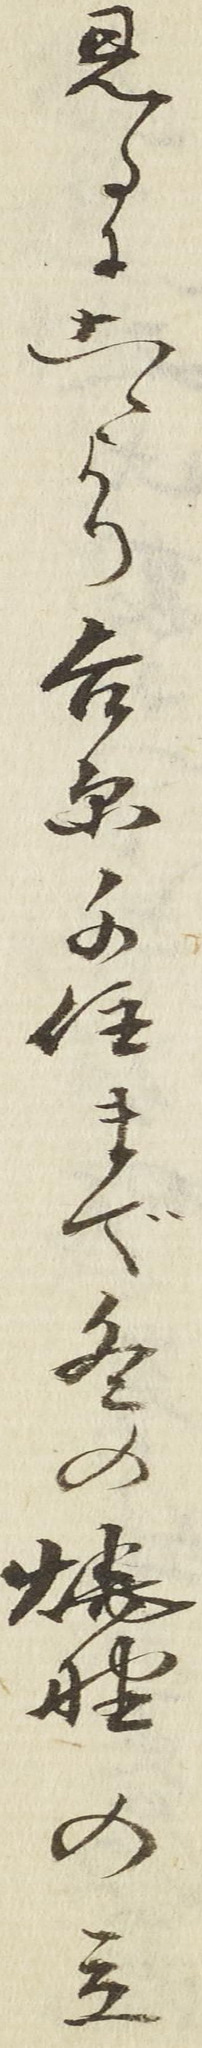見るにこゝより吉原千住まで冬の焼野の立
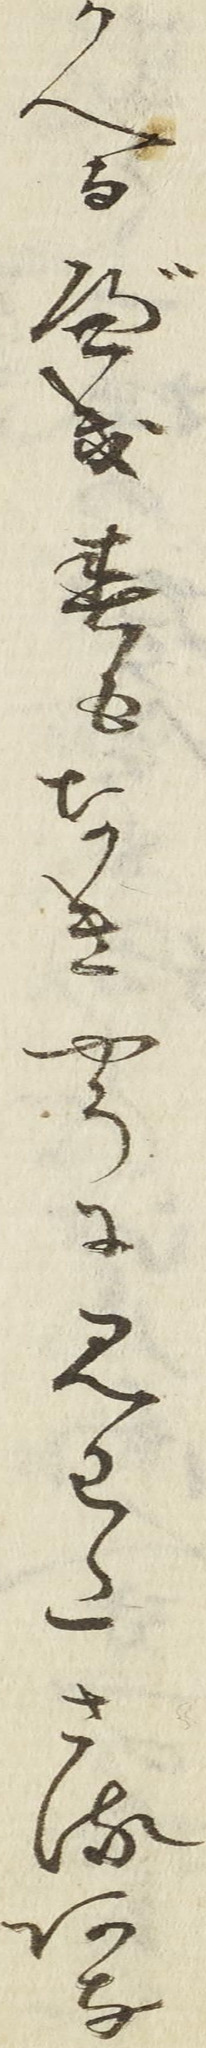かへるべき春もなきやうに見わたさるあな
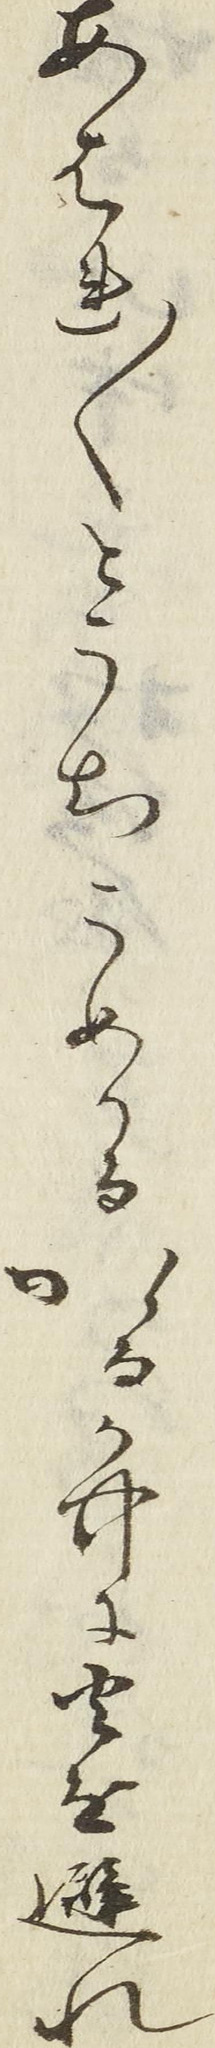あはれ〳〵とうちうめかるかゝるか中に火を避れ
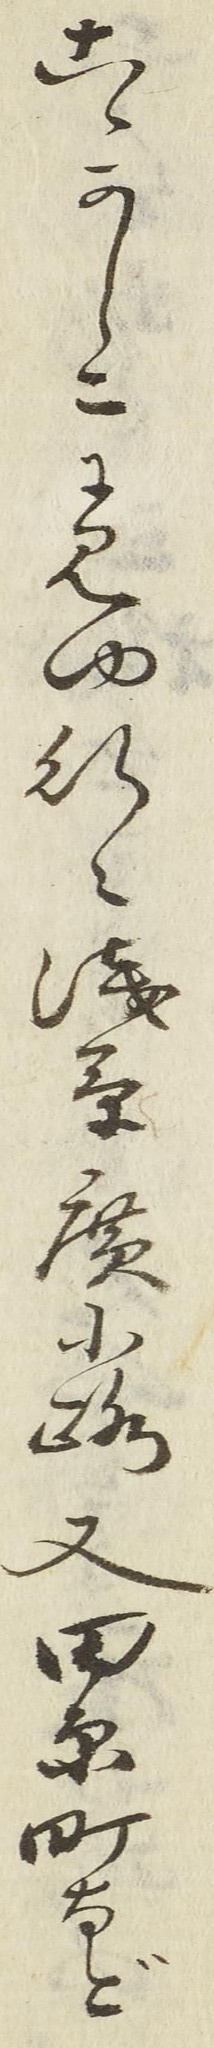こゝかしこに見ゆ行〻浅草広小路又田原町など
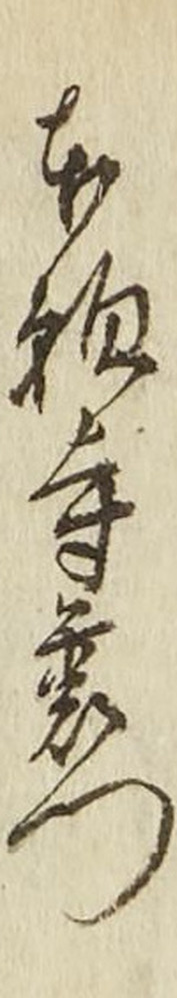本願寺裏門
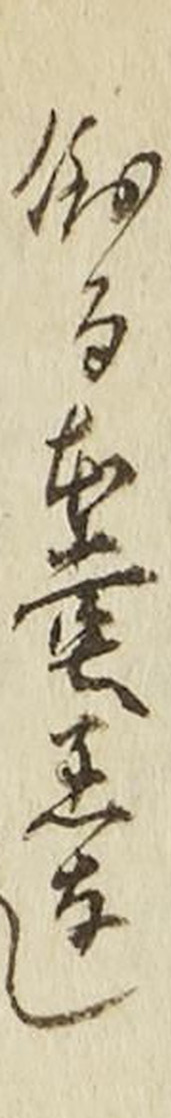倒る本堂恙なし
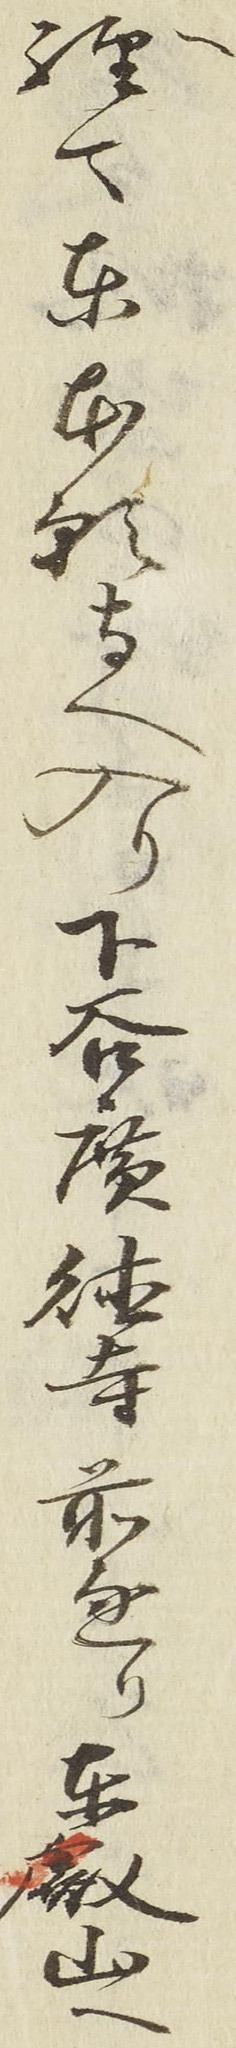経て東本願寺へ入り下谷広徳寺前通り東叡山へ
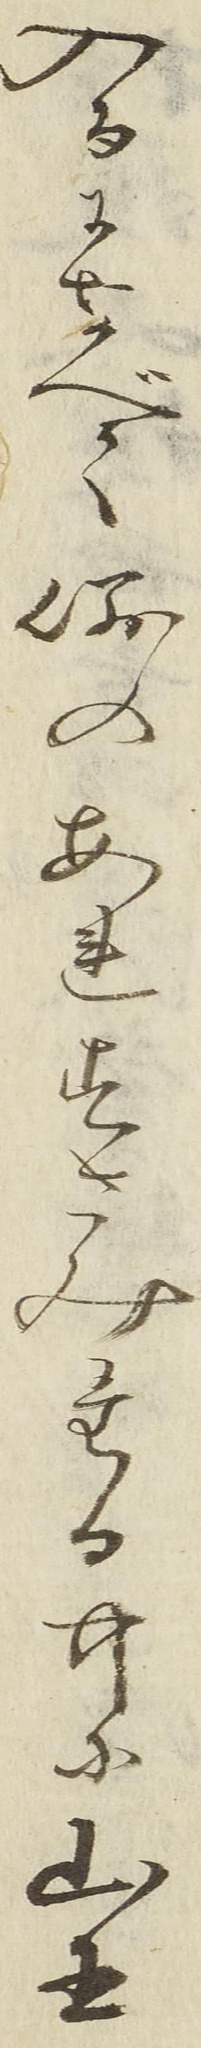入るになべて倒のあれすさみたる中に山王

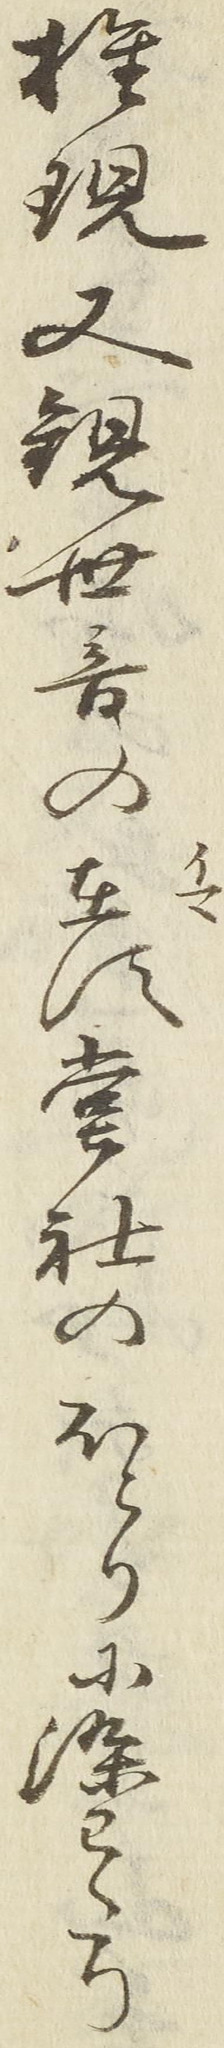権現又観世音の在す堂社のほとりに染わたり
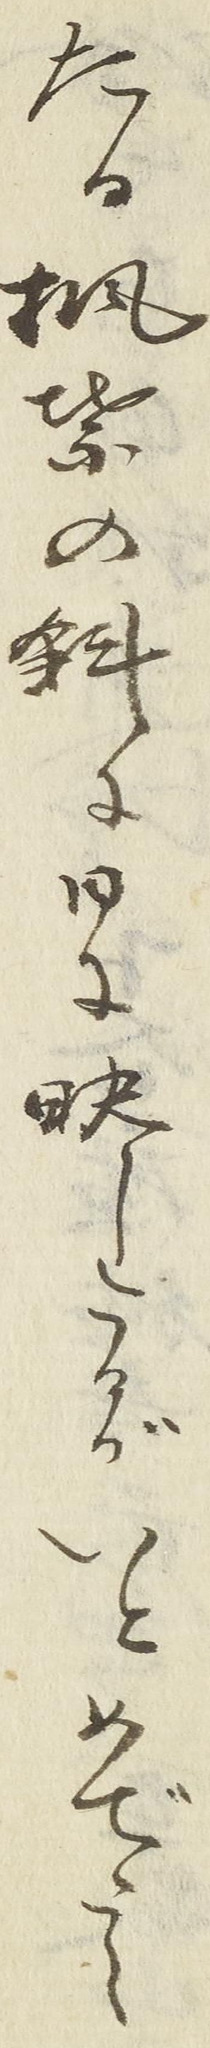たる楓葉の斜に日に映したるがいとめでたし
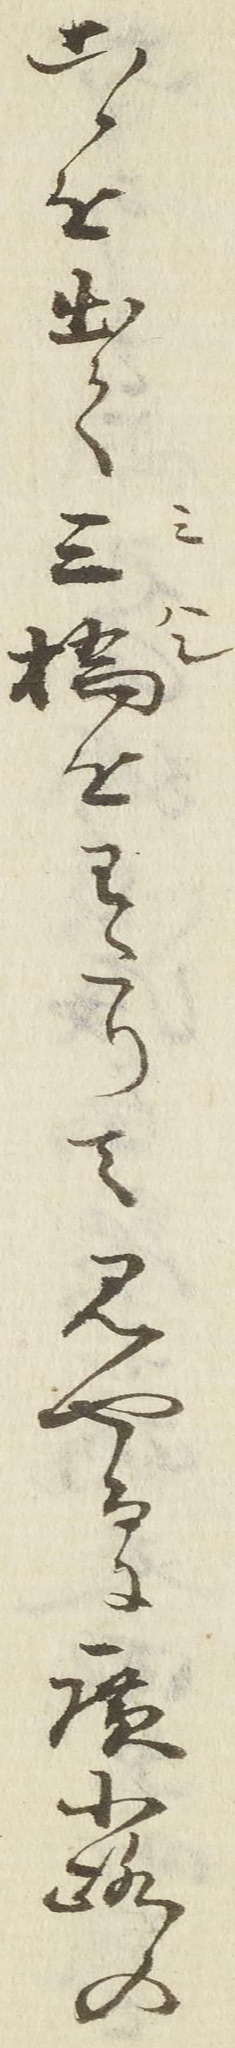こゝを出て三橋をわたりて見やるに広小路の
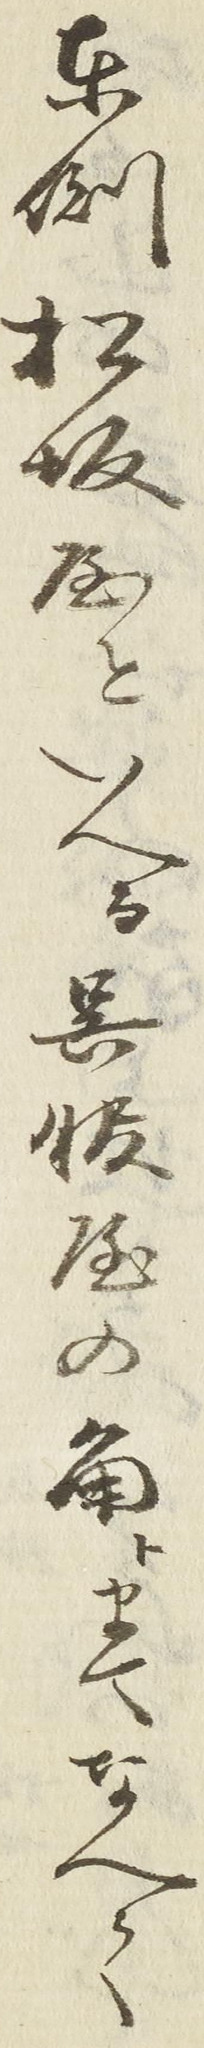東側松坂屋といへる呉服屋の角
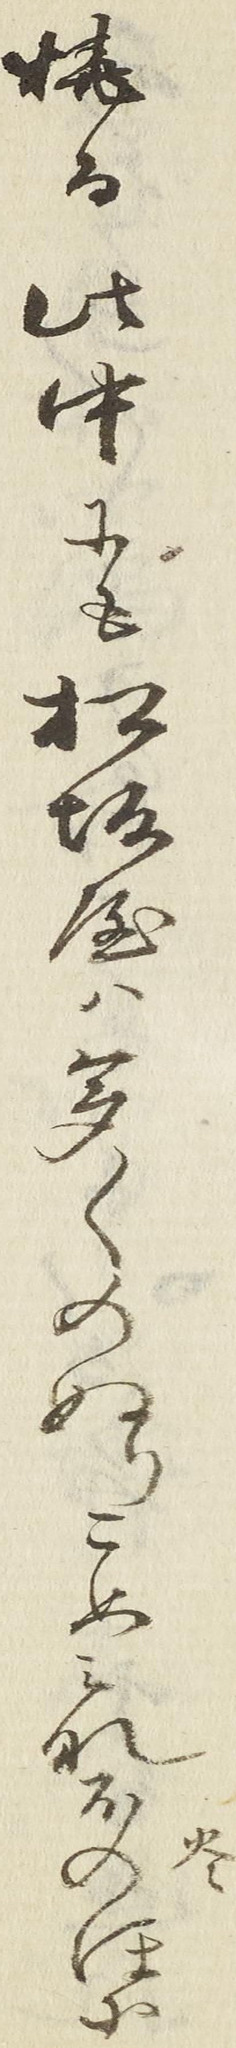焼る此中にも松坂屋は多くのぬりこめみなほのほ炎に
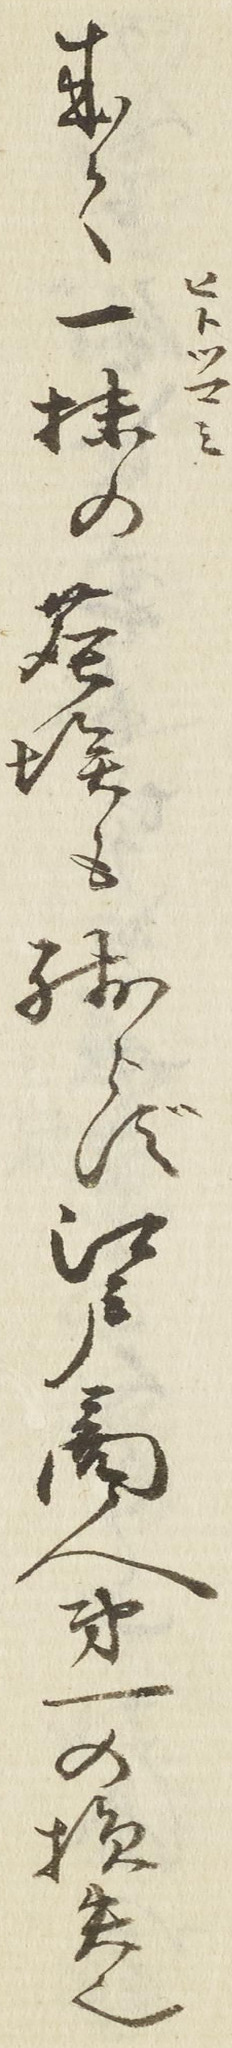成て一抹の塵埃も残らず江戸商人第一の損失也
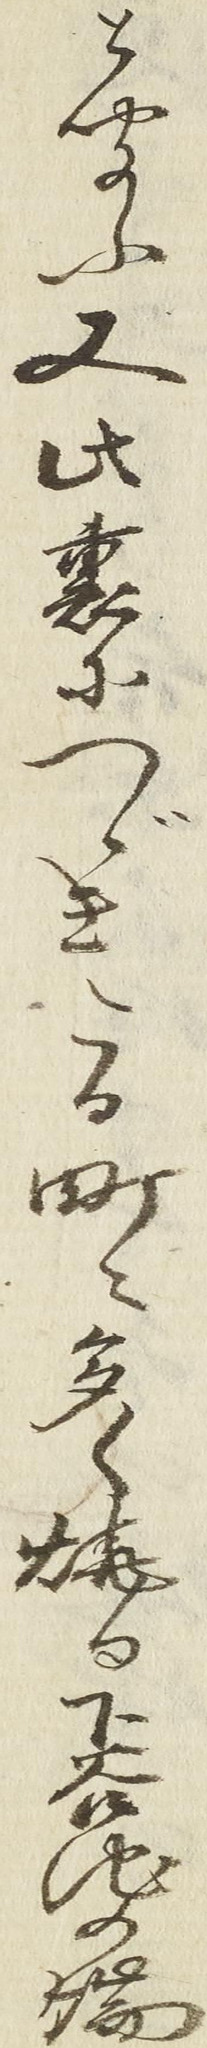と聞ふ又此裏につゞきたる町〻多く焼る下谷池の端
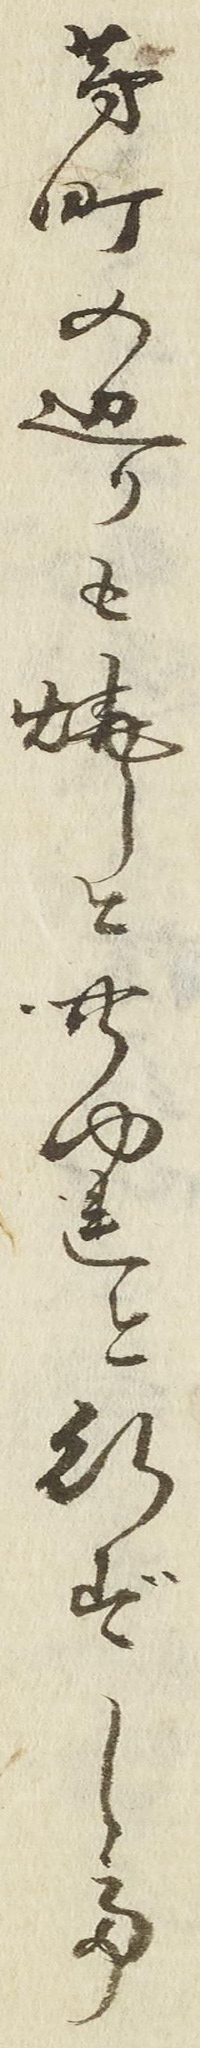茅町の辺りも焼しと聞ゆれと行ずして
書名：やぶれ窓の記　全
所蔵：東京大学地震研究所図書室 Earthquake Research Institute Library, The University of Tokyo, JAPAN
